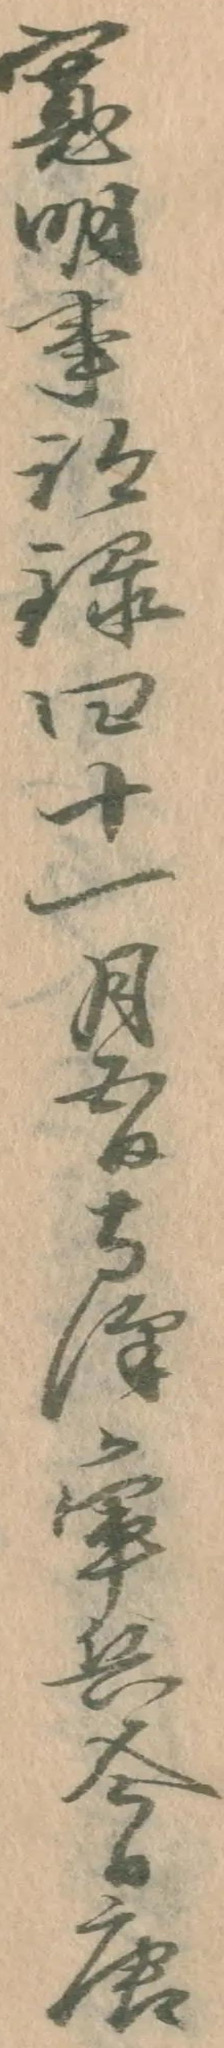寛明事跡録曰十一月五日寺沢か軍兵今日唐
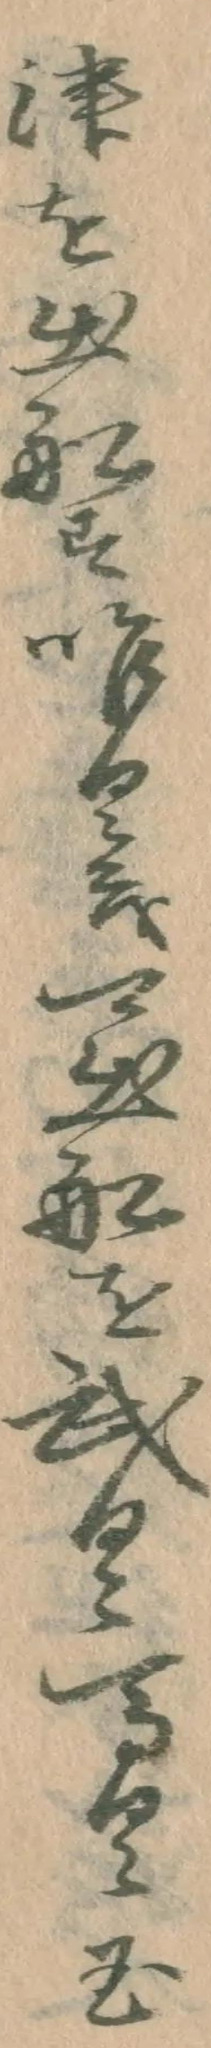津を出舩春昨日之義可出舩を武具馬具玉
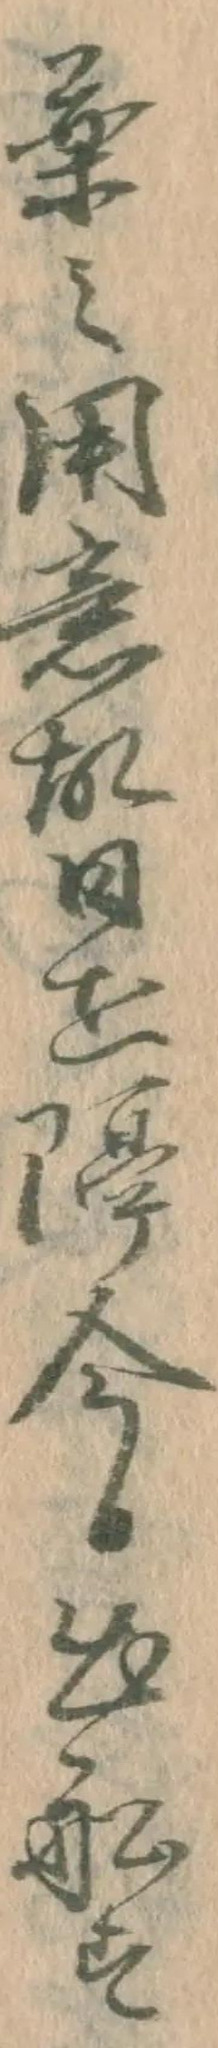薬之用意故日を隔今日出舩す
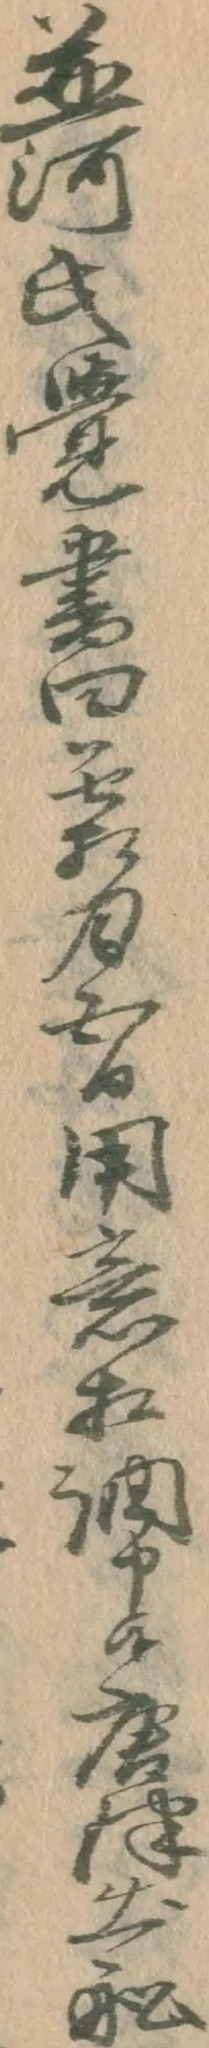並河氏覚書曰霜月五日用意相調申候唐津出陣
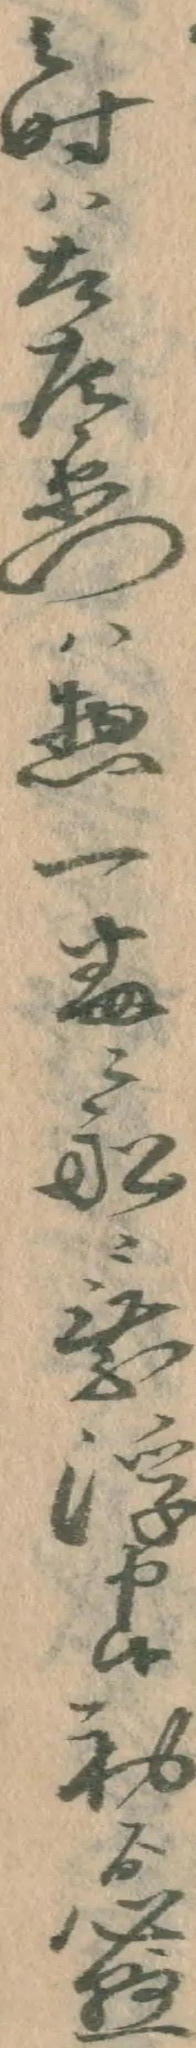之時は太左衛門は惣一番之舩に乗浮申候初ゟ心懸
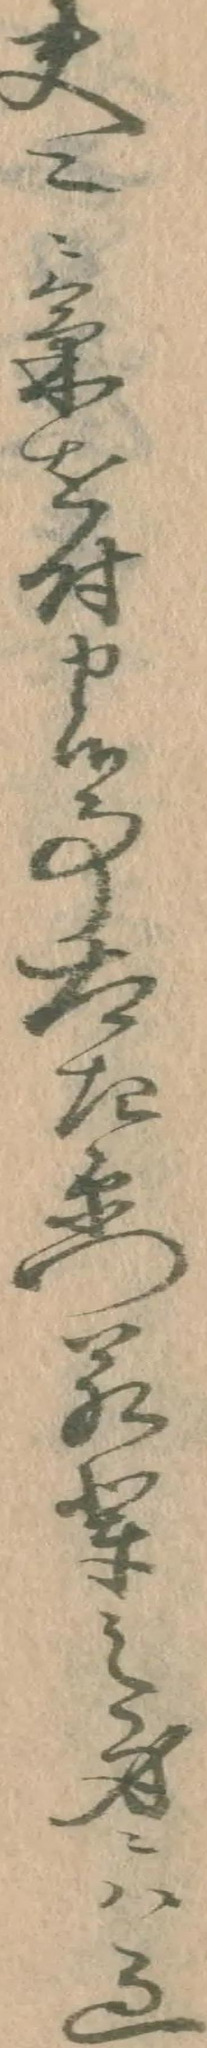夫々に而気を付申候事太左衛門若輩之身には過
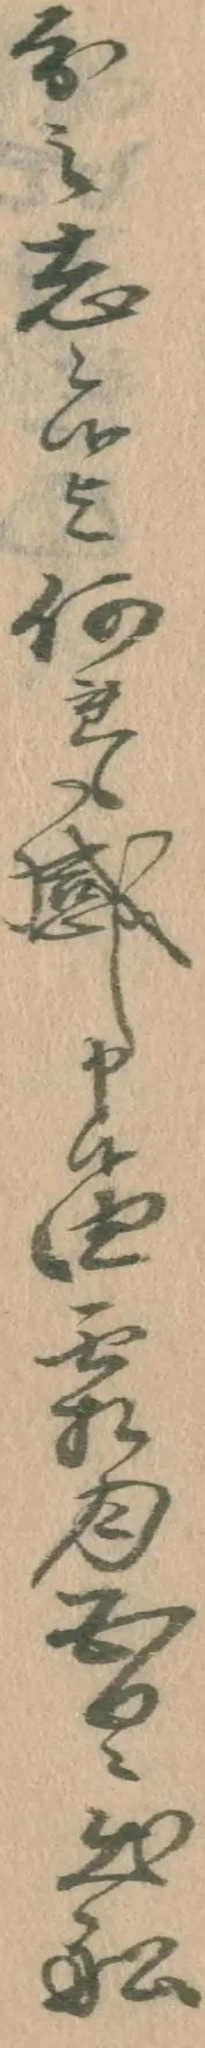分之志に候と何連も感し申候由霜月五日に出舩
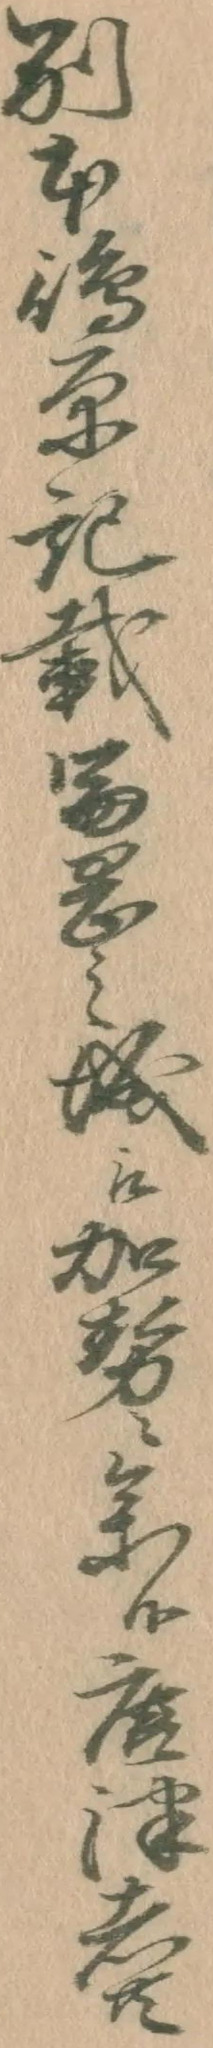別本島原記載冨岡之城江加勢に参候唐津者共
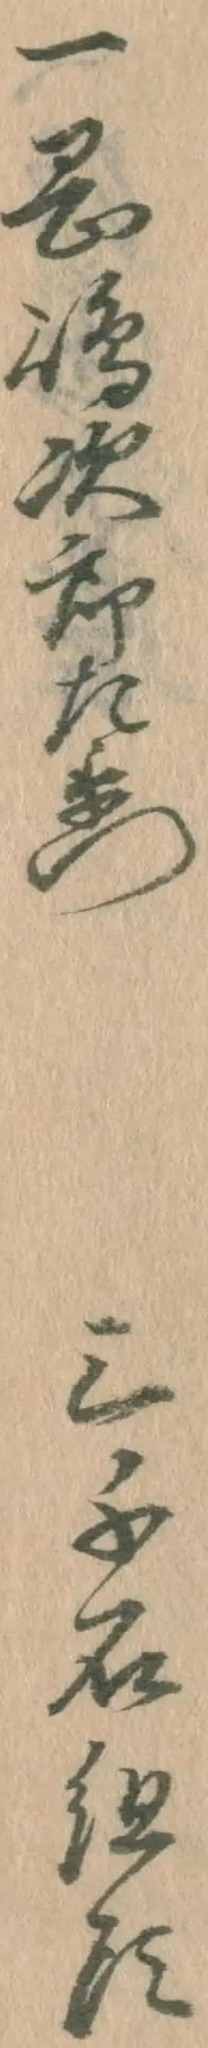一岡島次郎左衛門三千石組頭
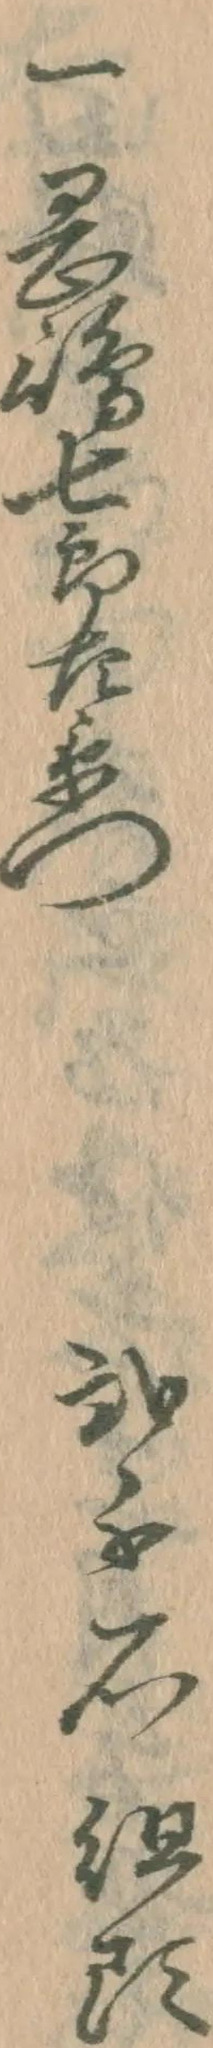一岡島七郎左衛門弐千石組頭
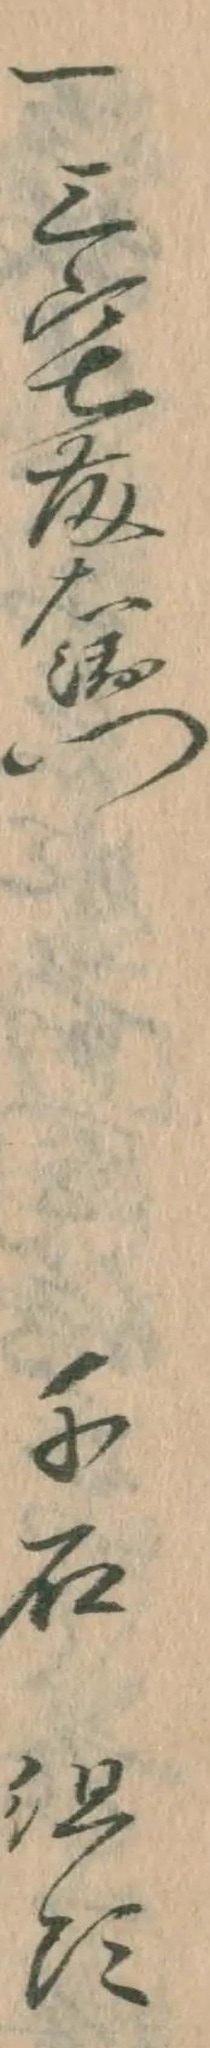一三宅藤右衛門千石組頭
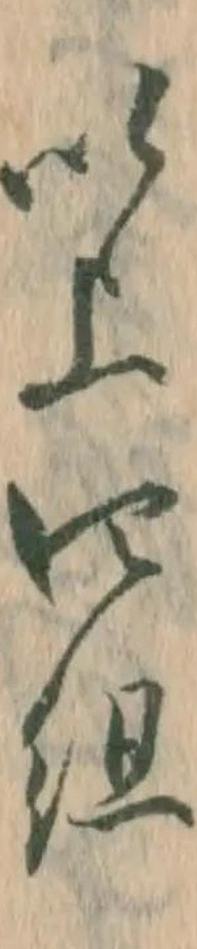以上四組
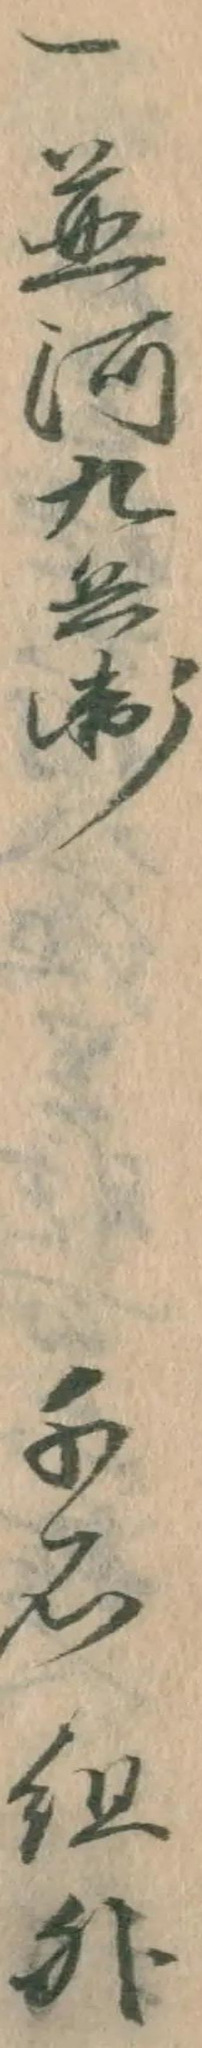一並河九兵衛千石組外
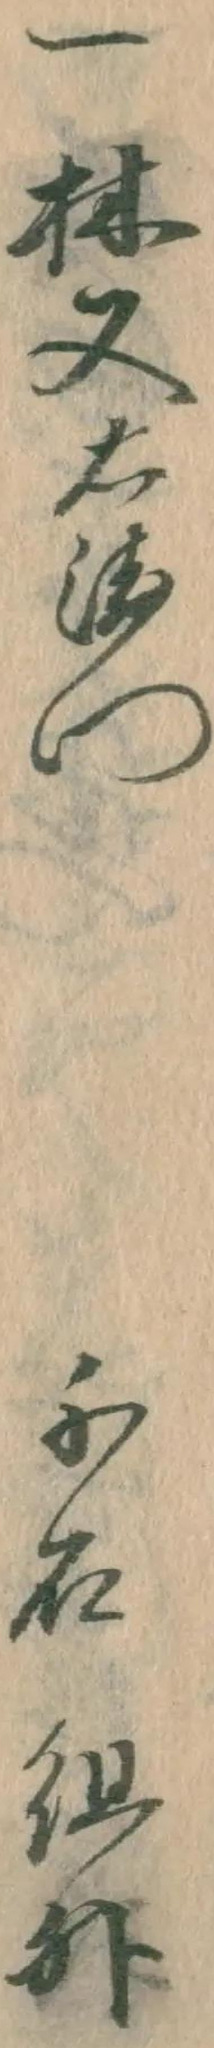一林又右衛門千石組外
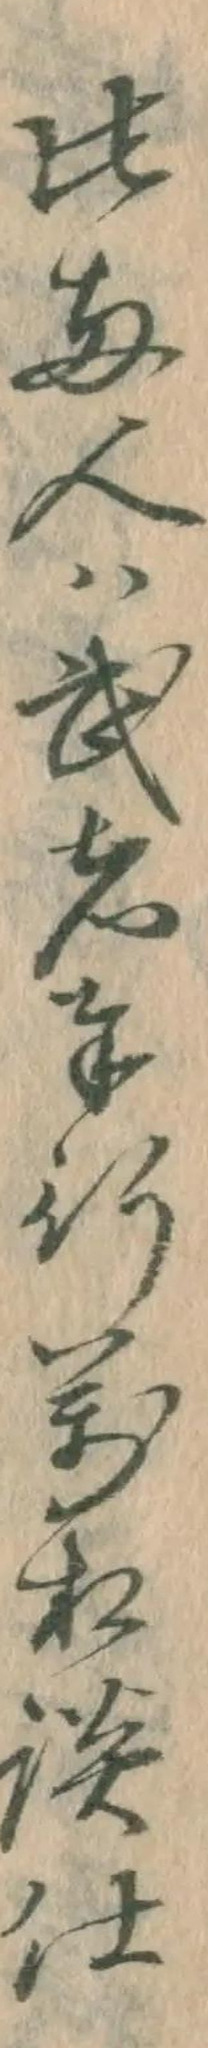此両人は武者奉行万相談仕
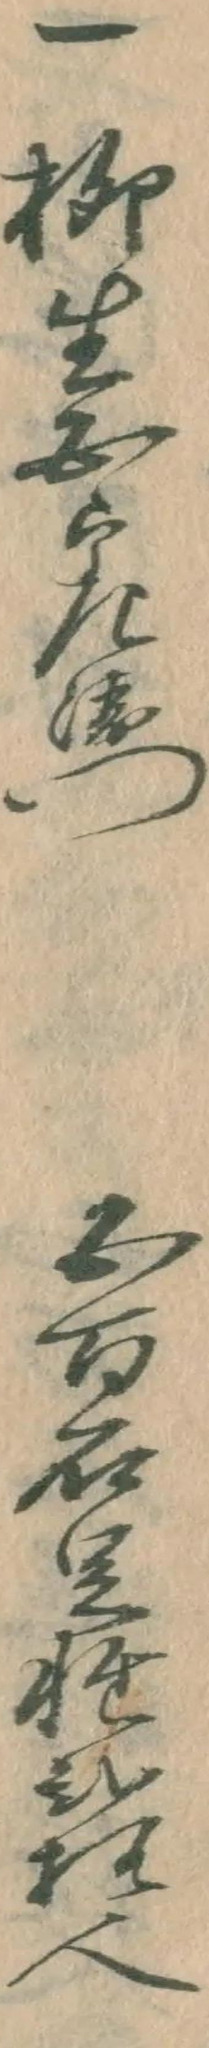一柳生五郎左衛門五百石足軽弐拾人
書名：切支丹御退治記 49巻. [2]
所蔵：国立国会図書館 National Diet Library, JAPAN
